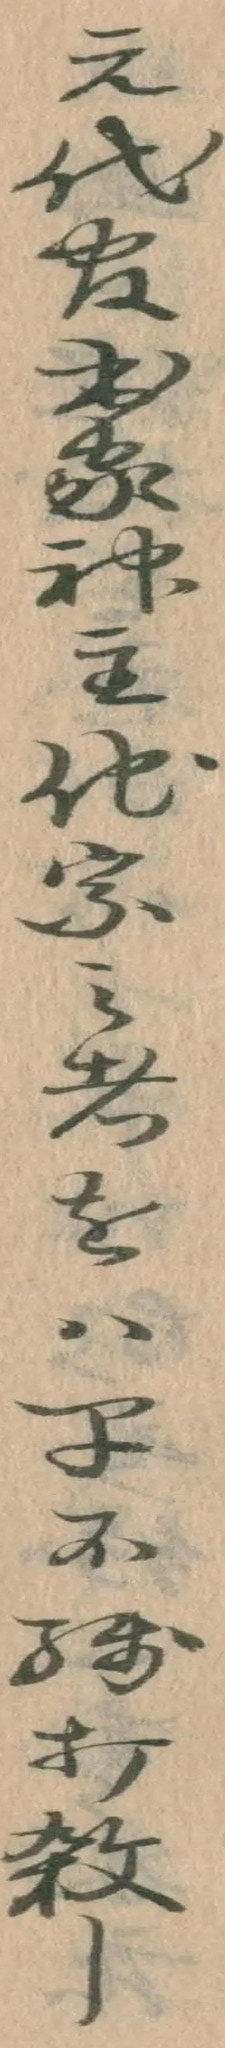元代官出家神主他宗之者をは早不残打殺し
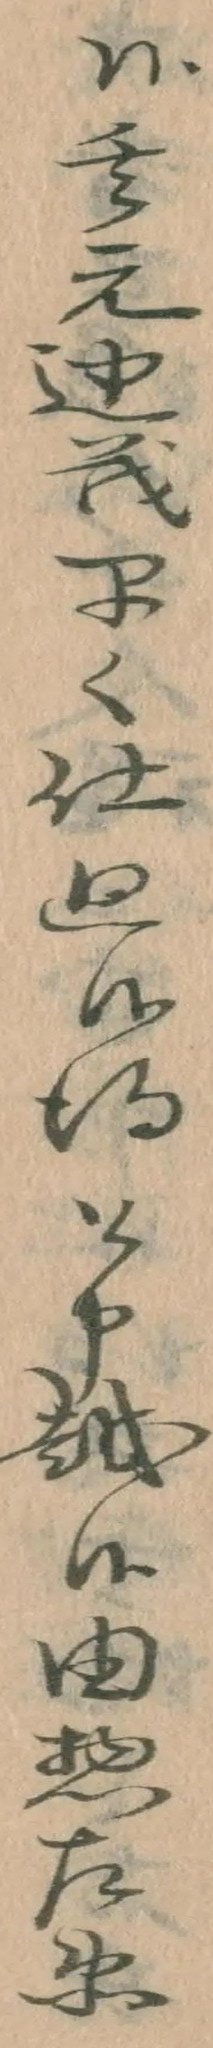候其元迚も早く仕廻候得と申越候由惣左衛
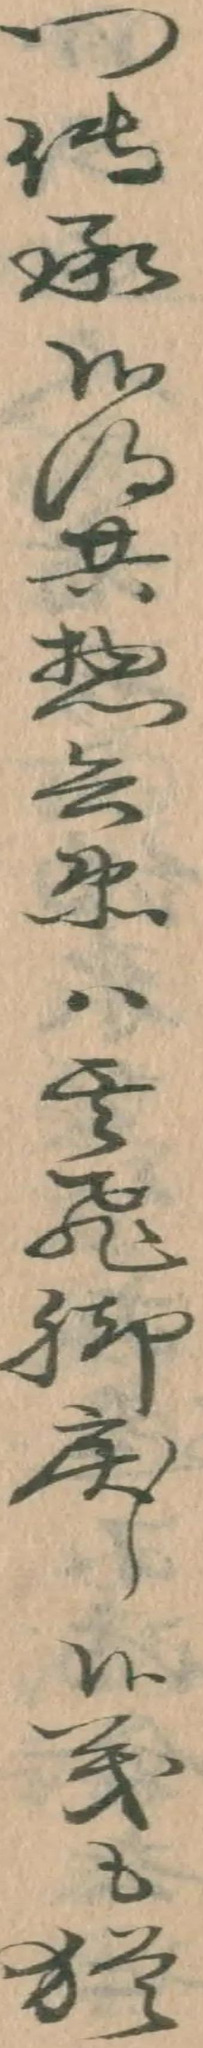門伝承候得共惣兵衛は其飛脚戻し候義も猶
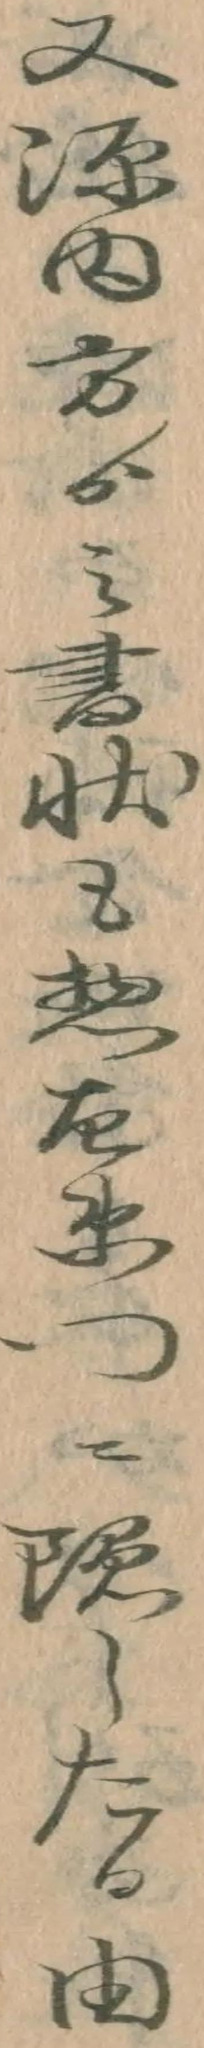又源内方ゟ之書状も惣左衛門に隠したる由
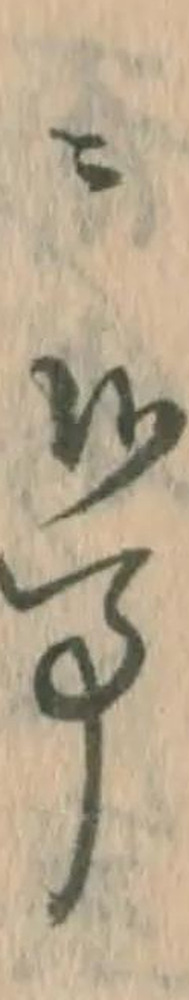に候事
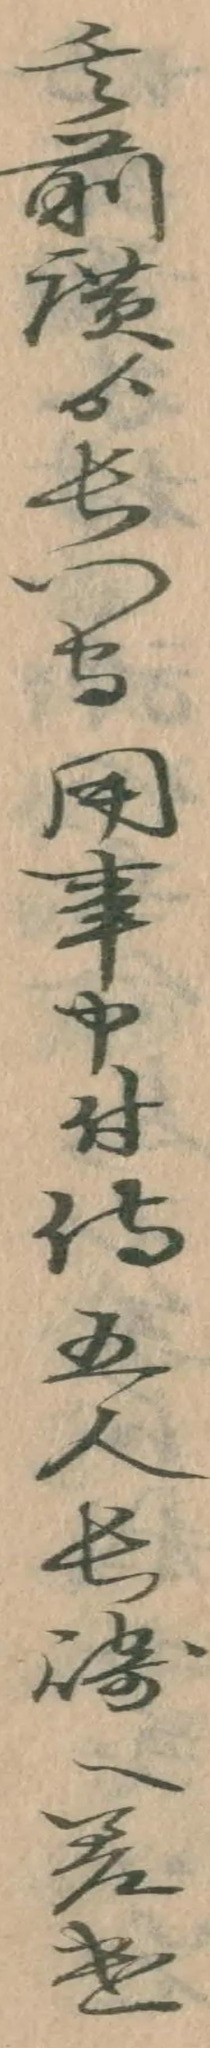其前広ゟ長門守用事申付侍五人長崎へ差遣
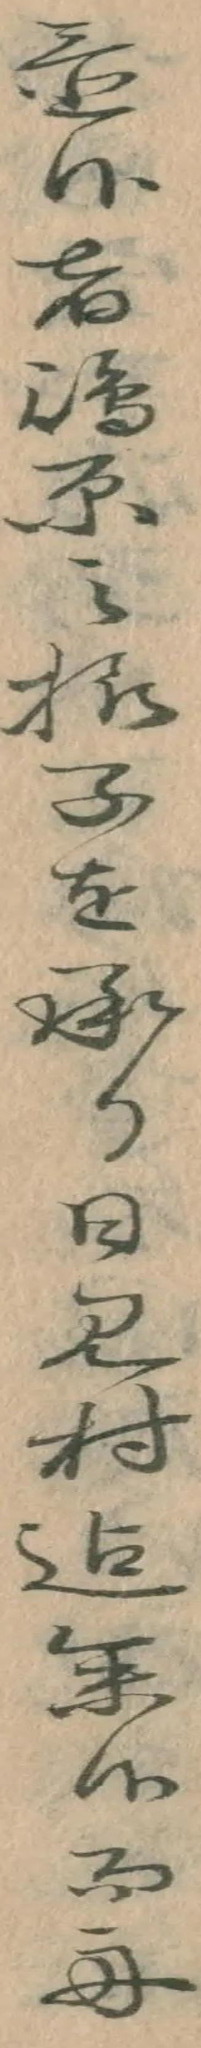置候者島原之様子を承り日見村迄参候而舟
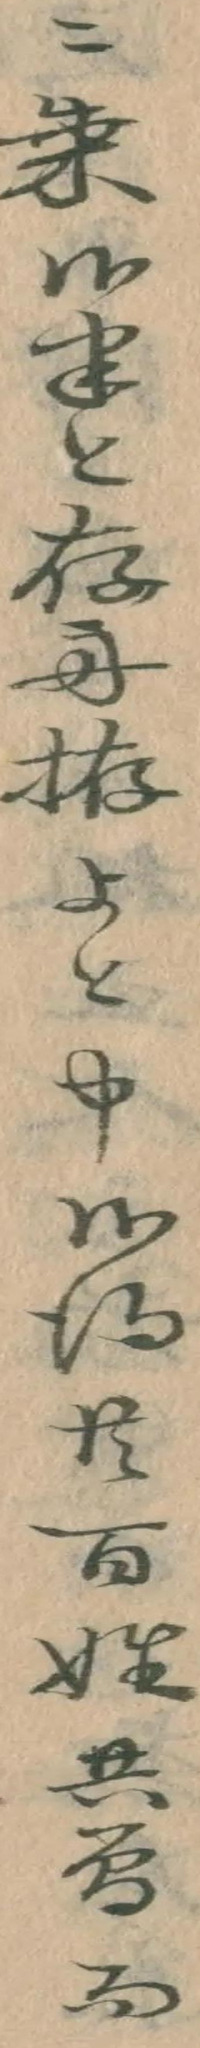に乗候半と存舟拵よと申候得共百姓共曽而
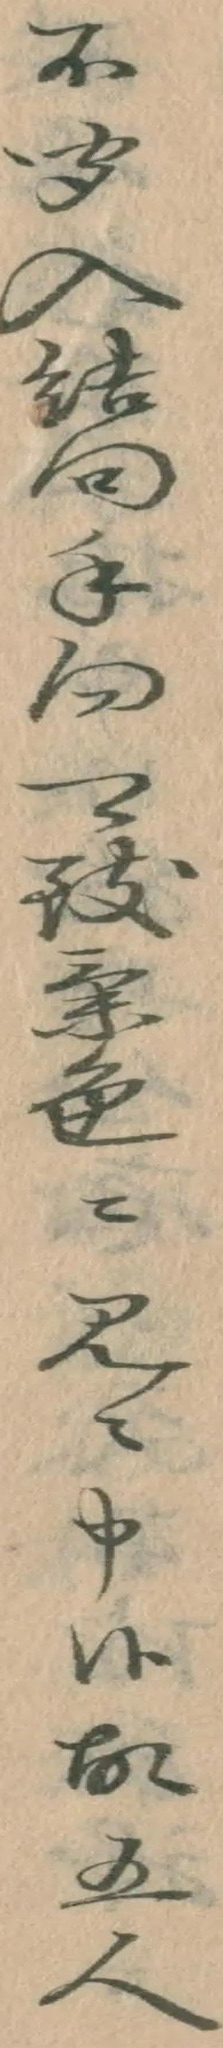不聞入結局手向可致気色に見て申候故五人
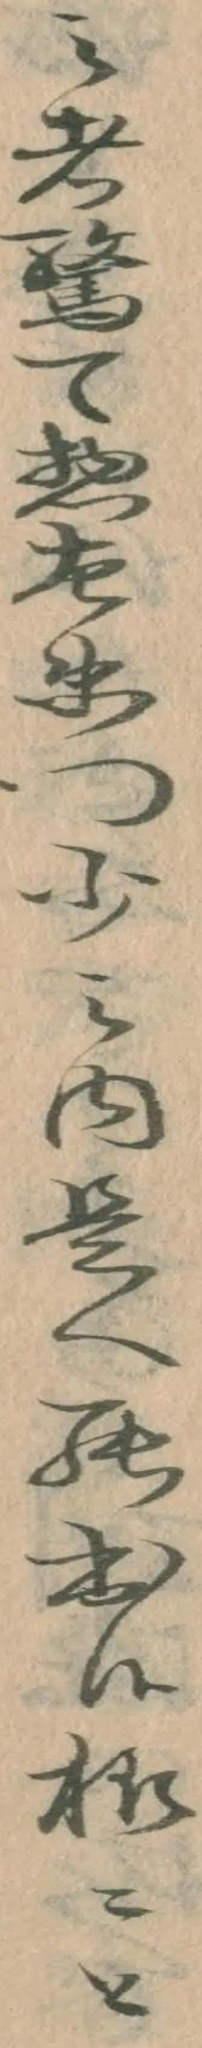之者驚て惣左衛門少之内是へ能出候様にと
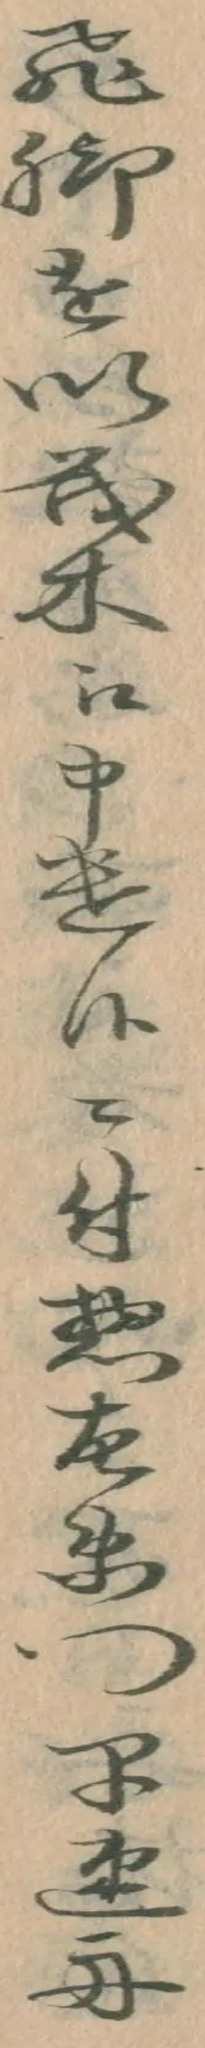飛脚を以茂木え申遣候に付惣左衛門早速舟
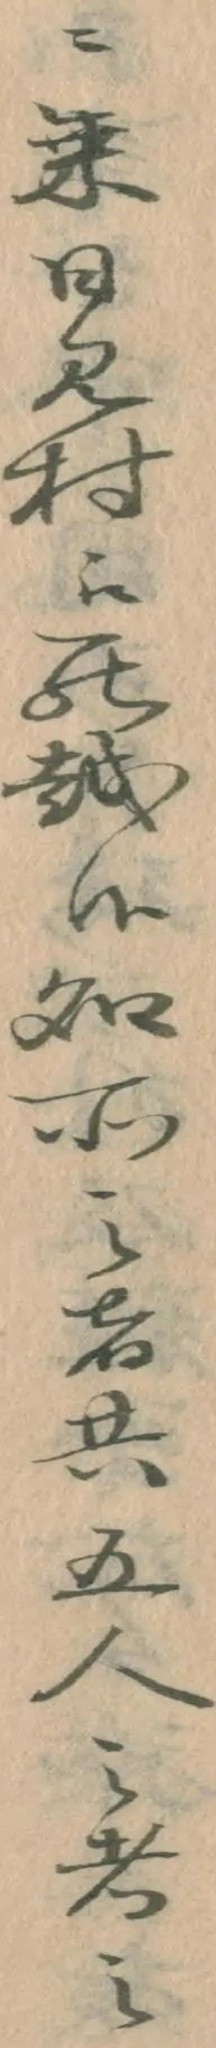に乗日見村え罷越候処所之者共五人之者之

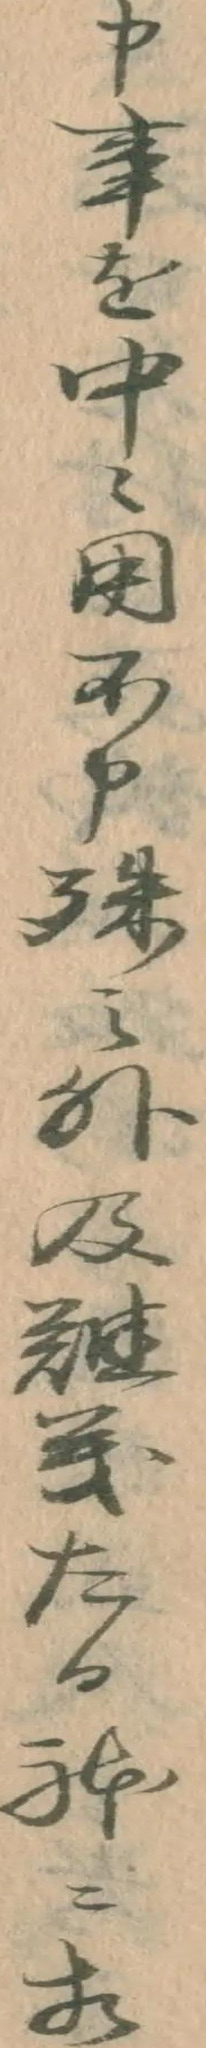申事を中々用不申殊之外及難義たる躰に相
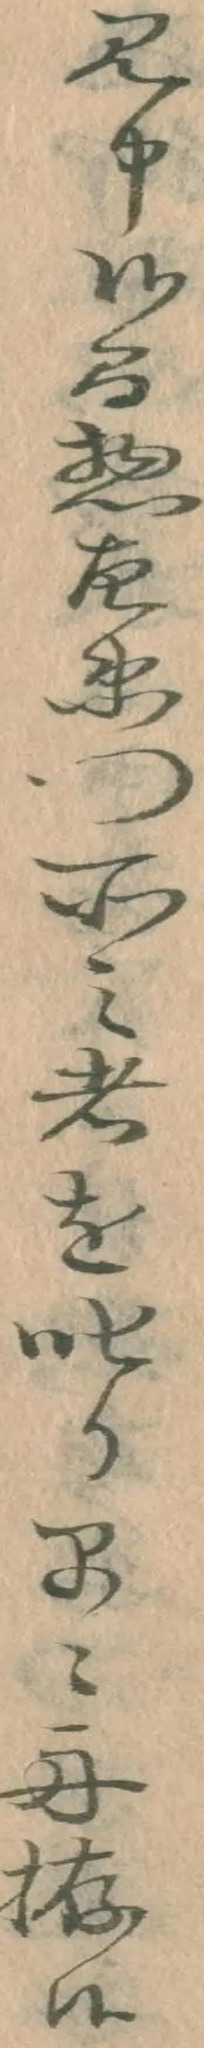見申候間惣左衛門所之者を叱り早々舟拵候
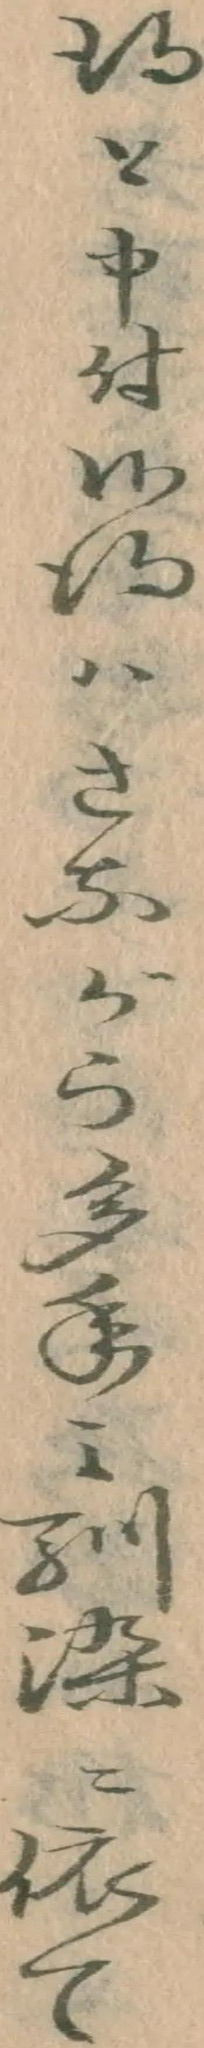得と申付候得はさながら多年之馴染に依て
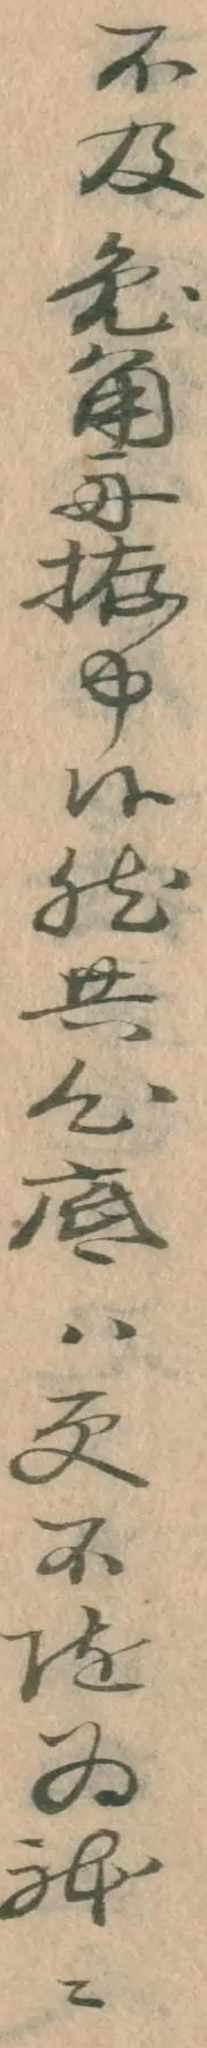不及兎角舟拵申候然共心底は更不随為躰に
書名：切支丹御退治記 49巻. [1]
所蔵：国立国会図書館 National Diet Library, JAPAN
